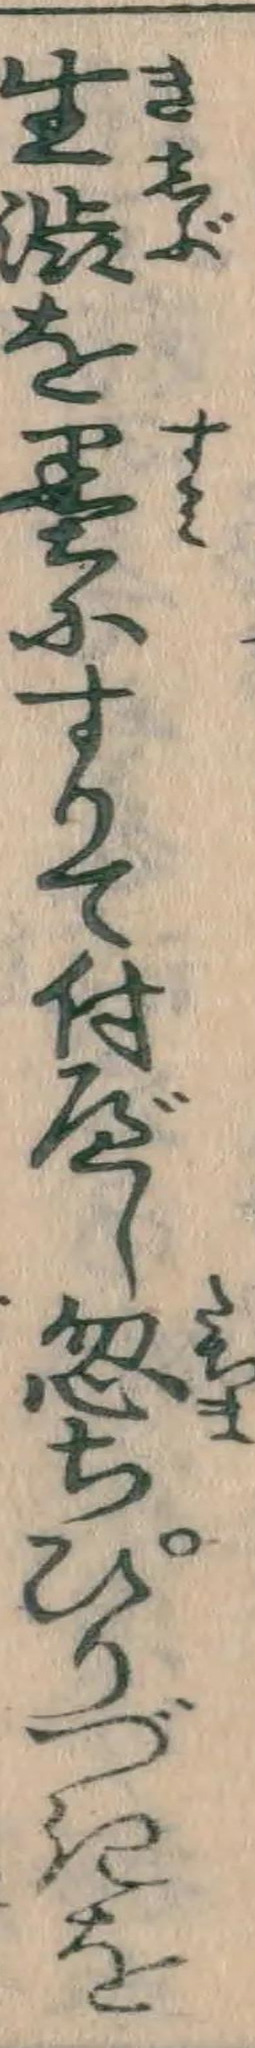生渋を墨にすりて付べし忽ちぴりづきを
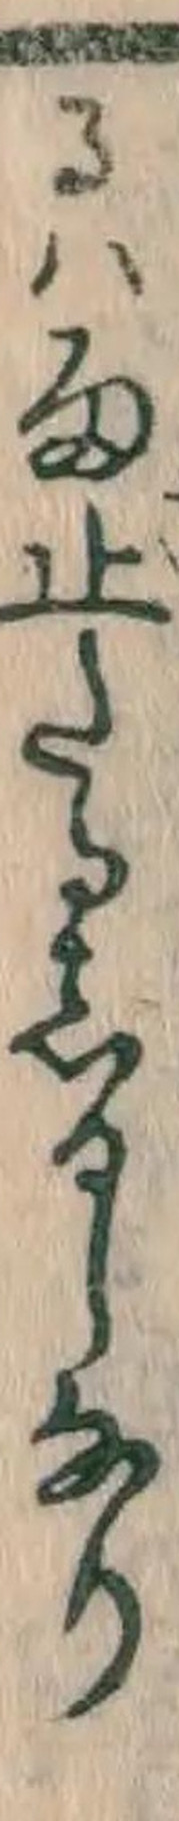るは雨止たるしるしなり
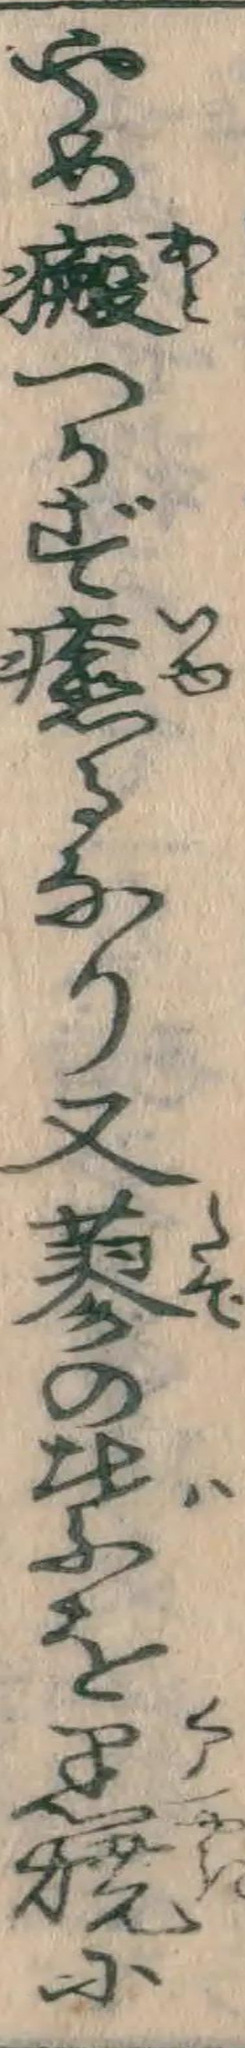やめ瘢つかず癒るなり又蓼の葉を黒焼に
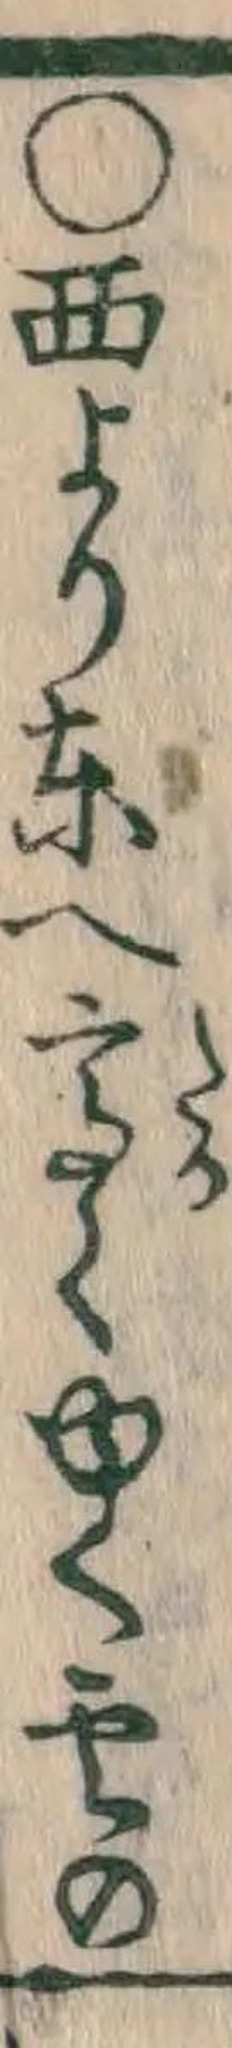○西より東へ高くゆく雲の
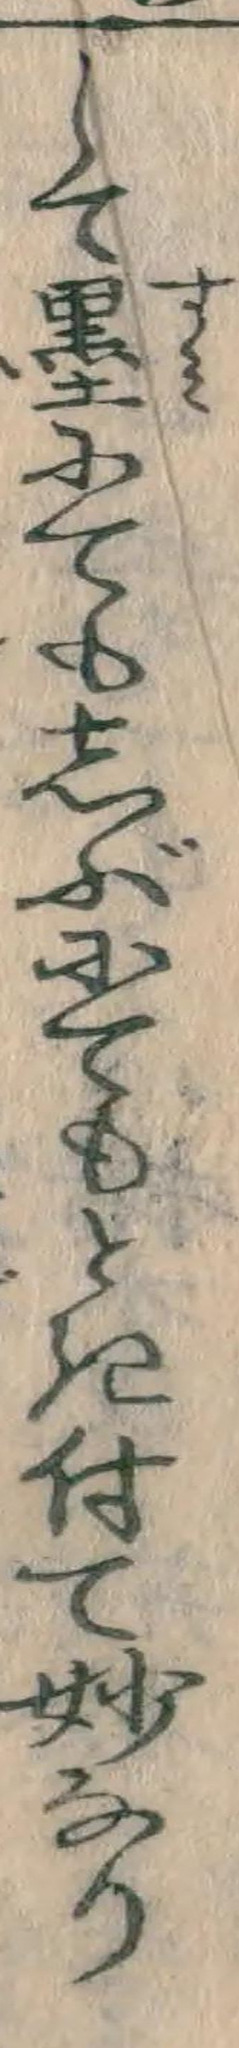して墨にてもしぶにてもとき付て妙なり
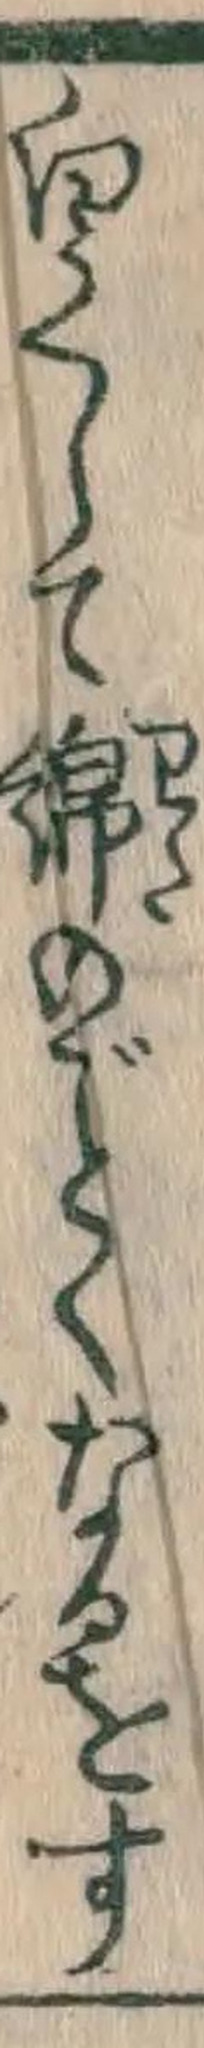白くして綿のごとくなるをす
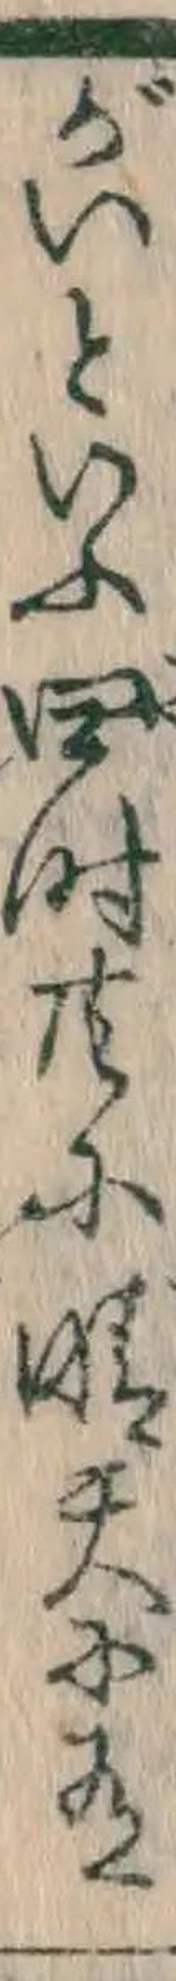がいといふ四時共に晴天に有
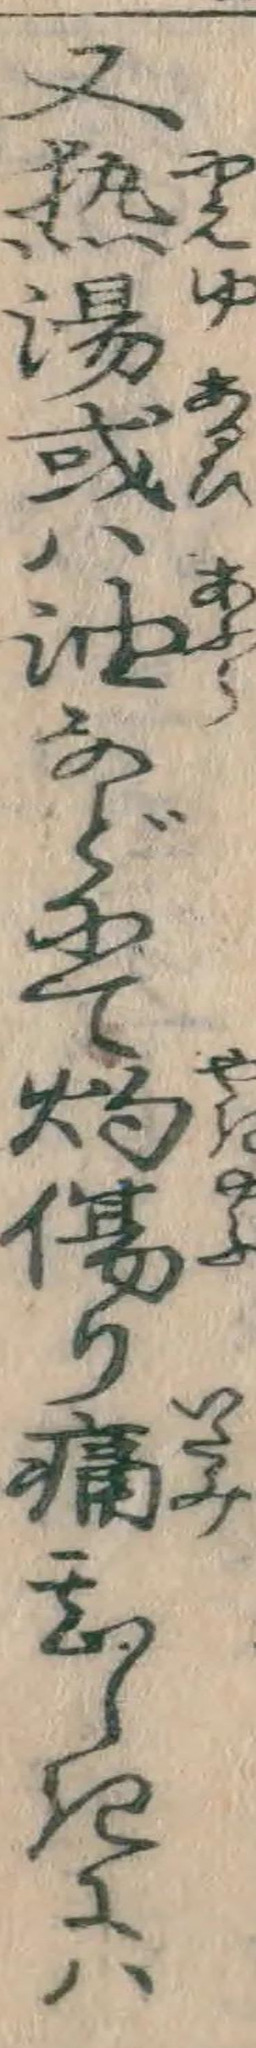又熱湯或は油などにて灼傷り痛甚しきには
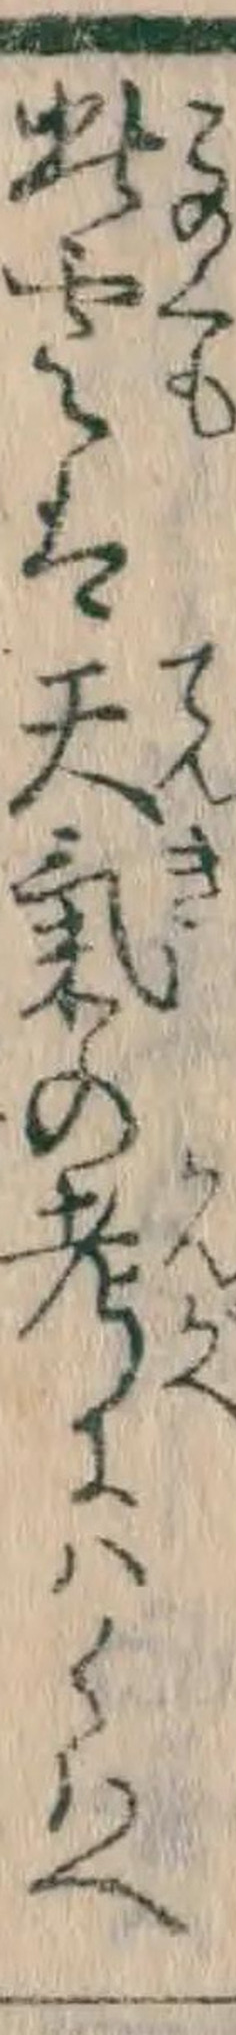此雲は天気の考にはくはへ
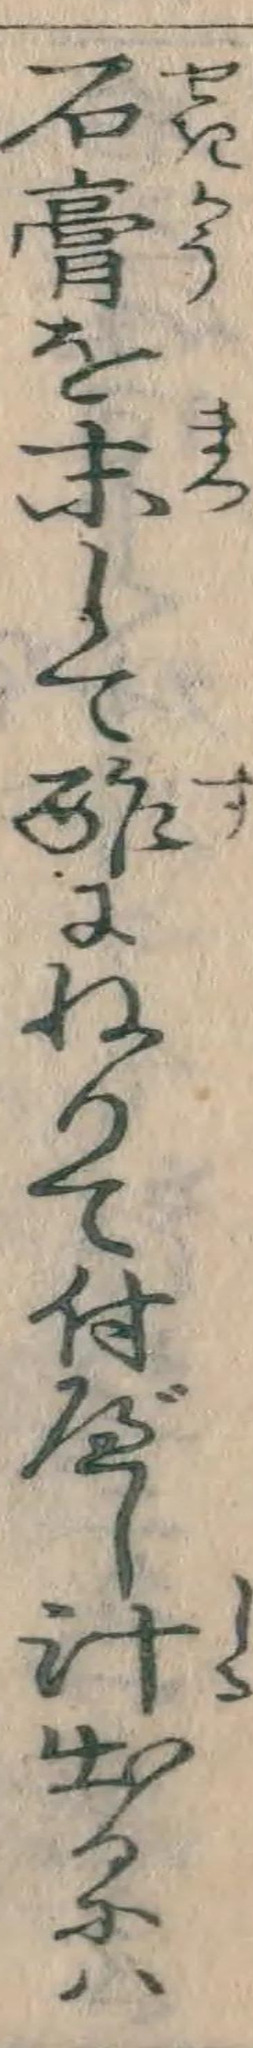石膏を末して酢にねりて付べし汁出るには
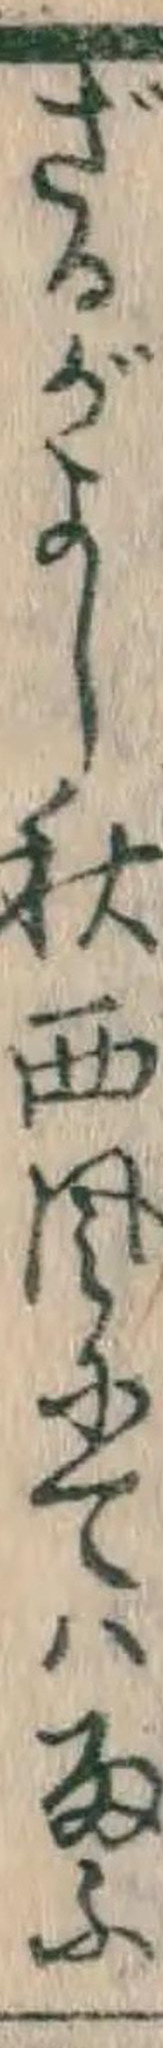ざるがよし秋西風にては雨ふ
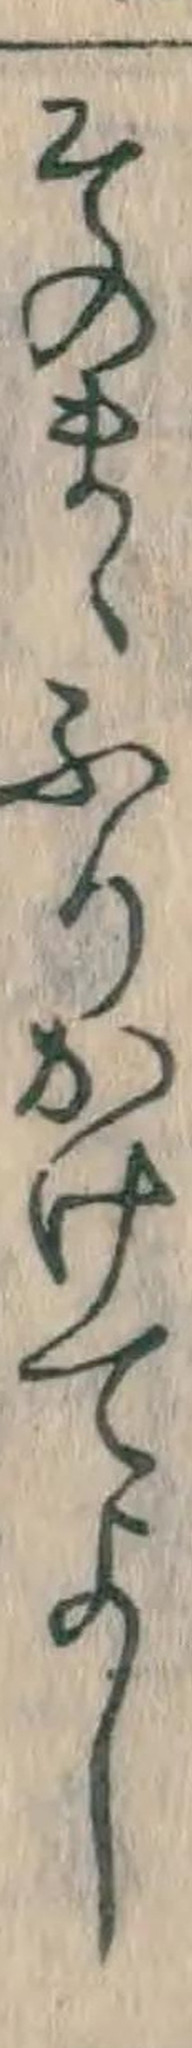そのまゝふりかけてよし
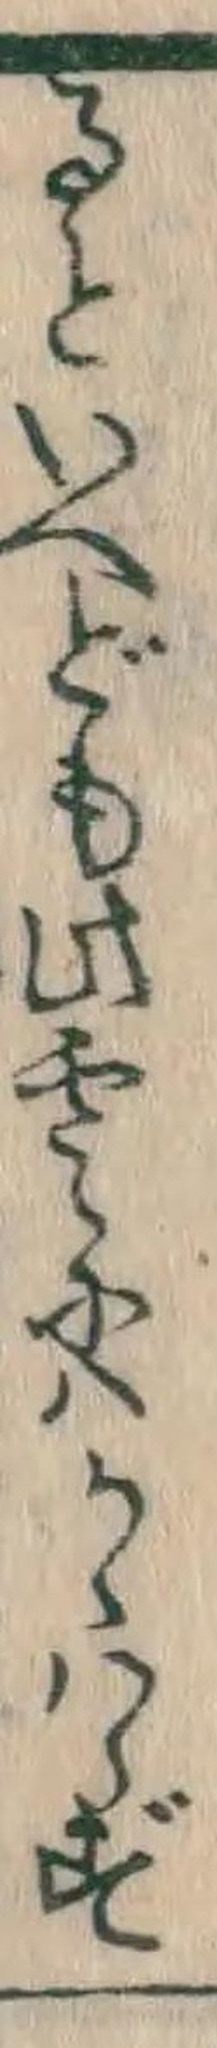るといへども此雲にはかゝはらず
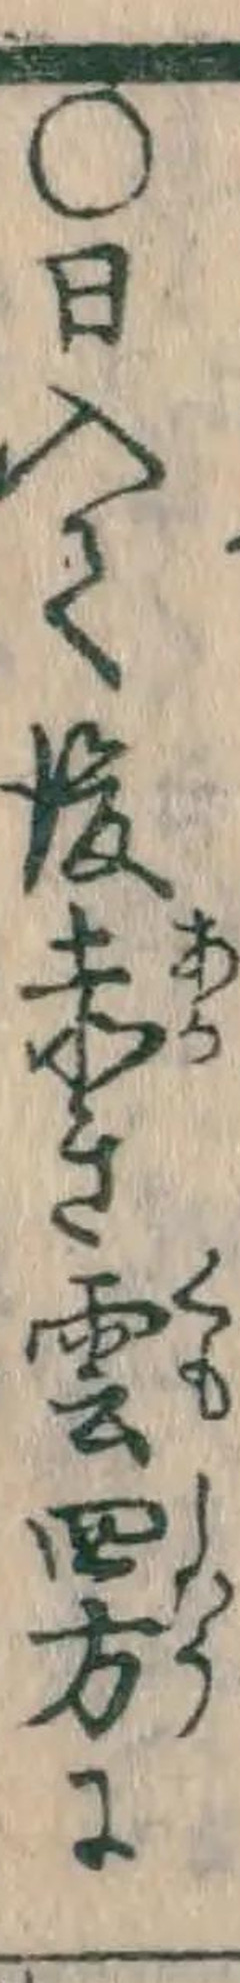○日入て後赤き雲四方に
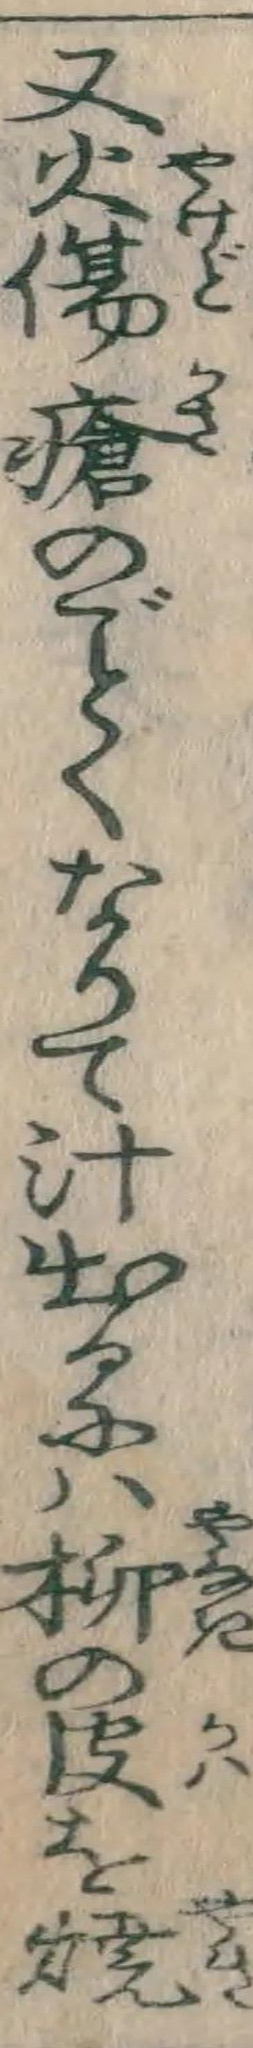又火傷瘡のごとくなりて汁出るには柳の皮を焼
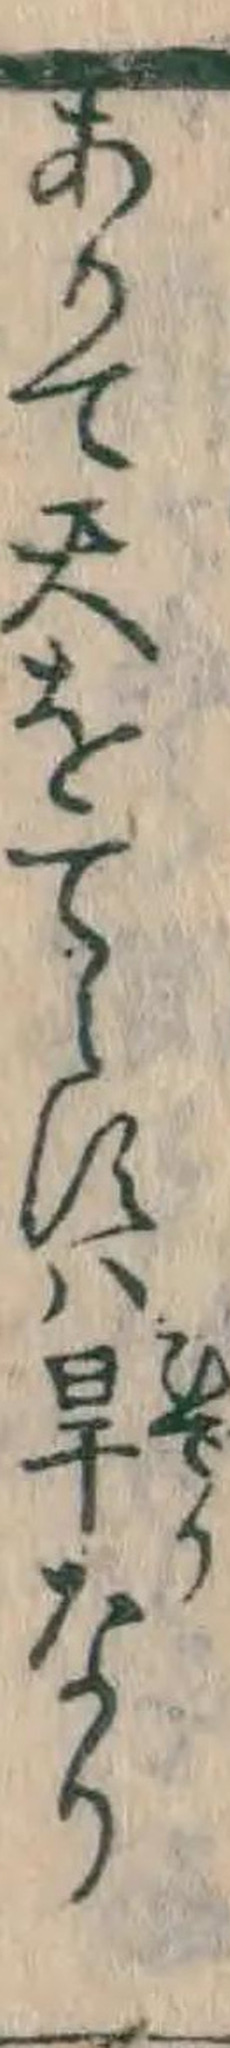ありて天をてらすは旱なり
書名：広益秘事大全 3巻. [4]
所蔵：国立国会図書館 National Diet Library, JAPAN
